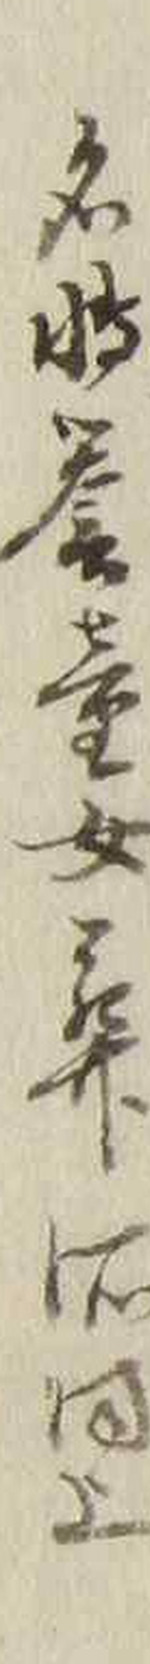名転誉童女葬所同上

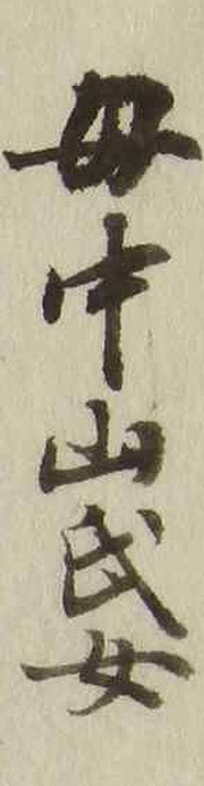母中山氏女
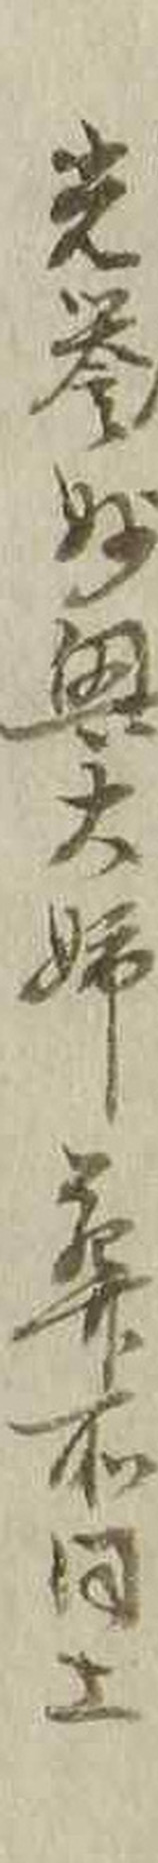光誉妙興大姉葬所同上
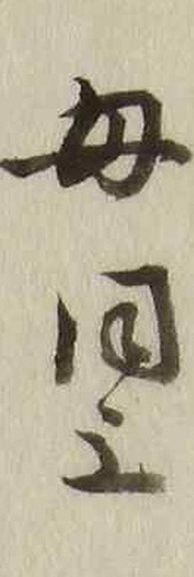母同上
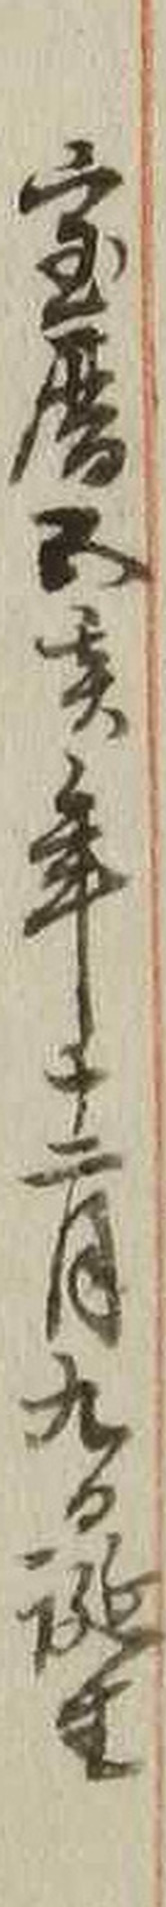宝暦五亥年十二月九日誕生
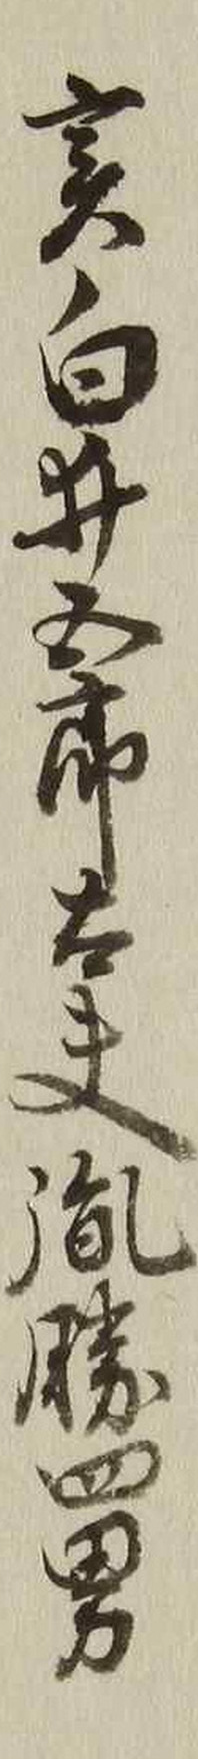実白井五郎太夫胤勝四男
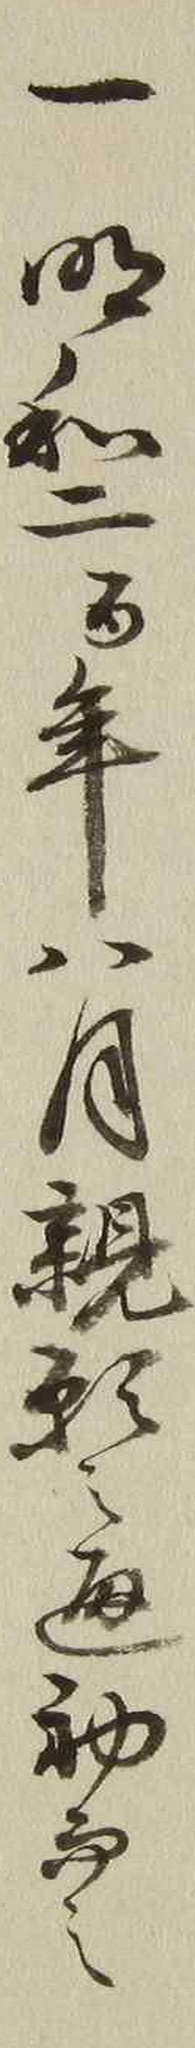一明和二酉年八月親願之通初而之
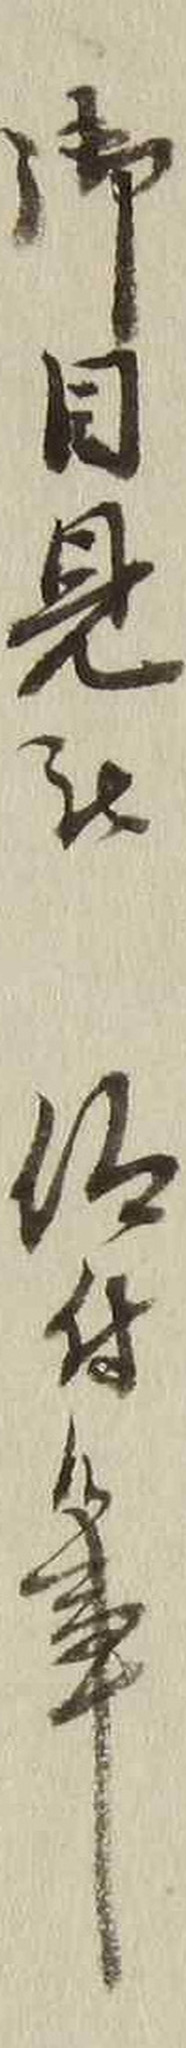御目見被仰付候事
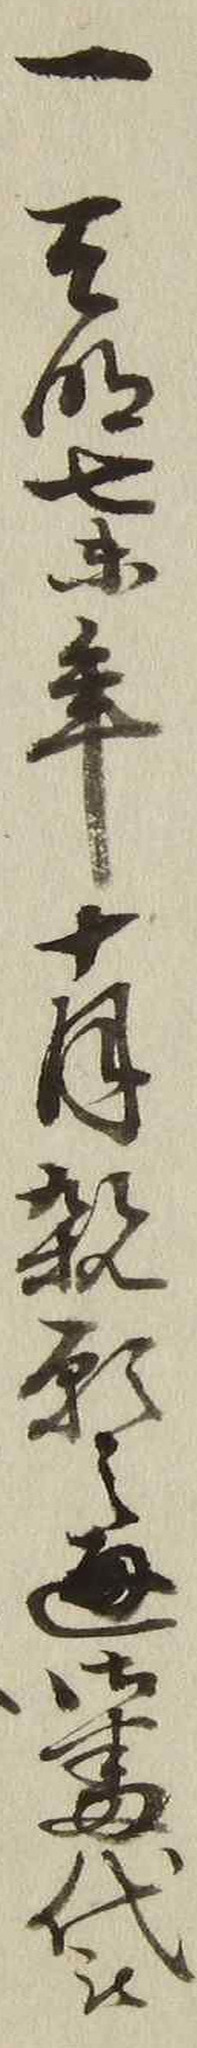一天明七未年十月親願之通御番代被
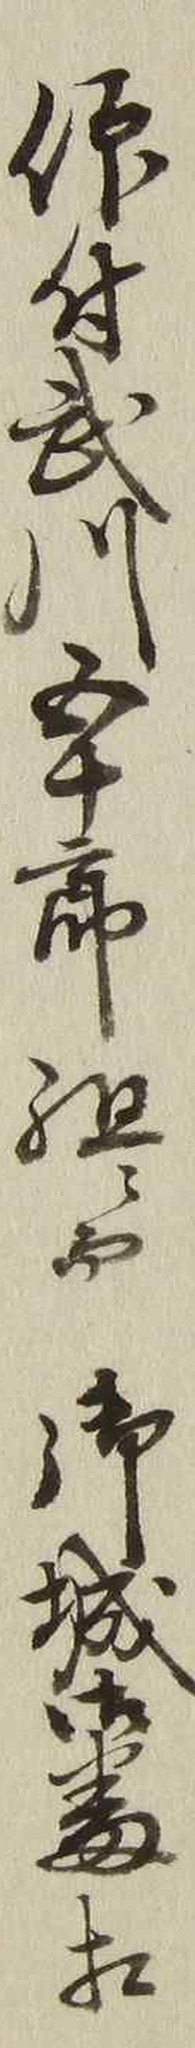仰付武川五十郎組ニ而御城御番相
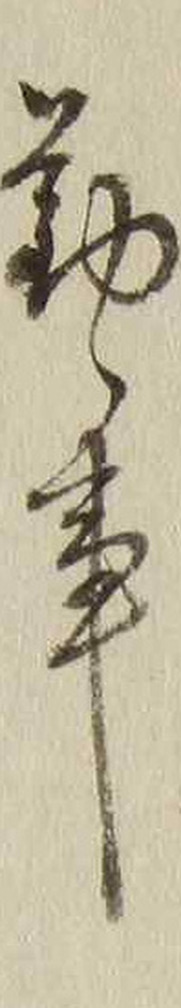勤候事
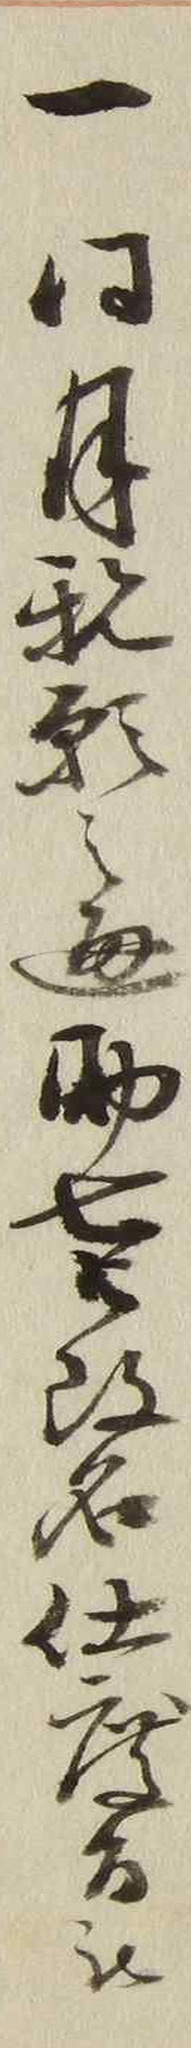一同月親願之通助七与改名仕度旨被
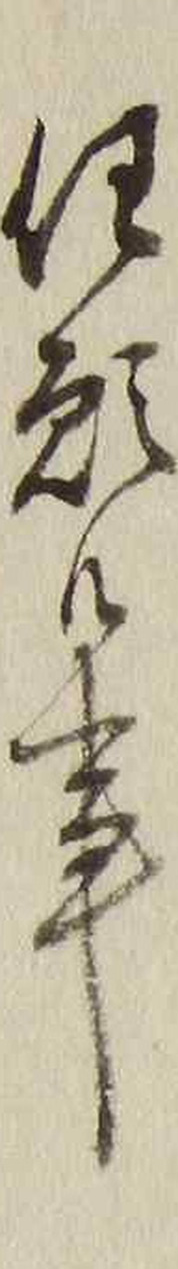任願候事
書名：諸士系譜　巻之27　い之部27
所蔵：会津若松市立会津図書館
